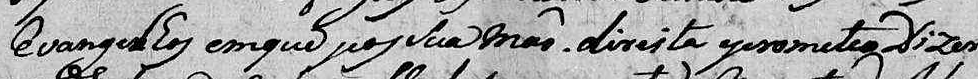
Evangelhos em que pos sua maõ. direita e prometeo Dizer
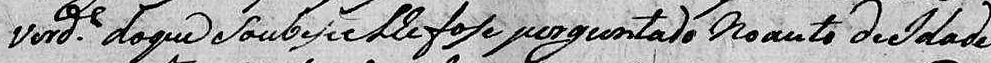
verd.e do que soubese e lhe fose perguntado no auto de Idade
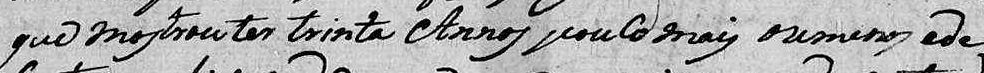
que mostrou ter trinta Annos pouCo mais ou menos e de
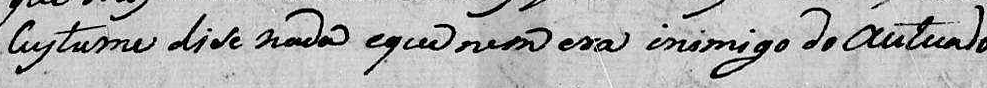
Custume dise nada e que nem era inimigo do autuado
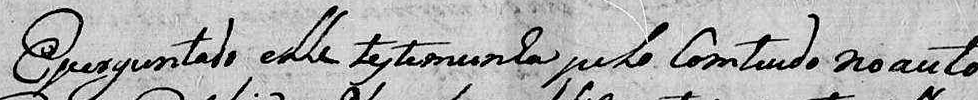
E perguntado elle testemunha pelo Comteudo no auto
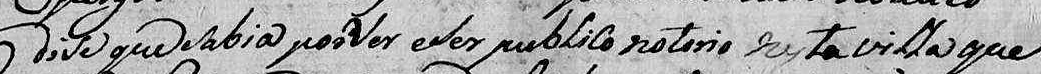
dise que sabia por Ver e ser publiCo notorio nesta villa que
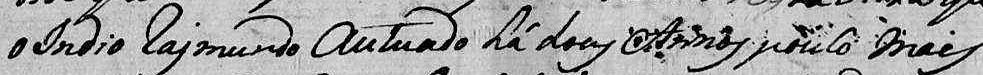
o Indio Rajmundo Autuado há dous Annos pouCo mais
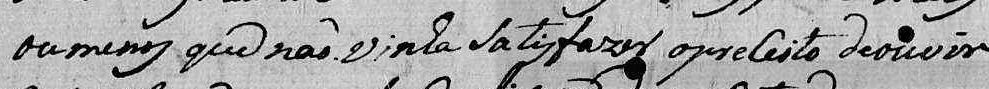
ou menos que naõ vinha Satisfazer o preCeito de ouvir
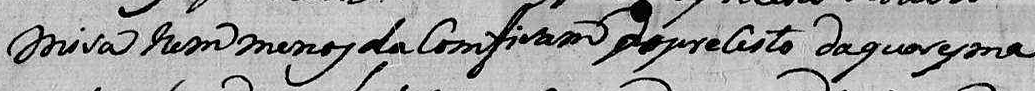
misa nem menos da Comfisam do preCeito da quaresma
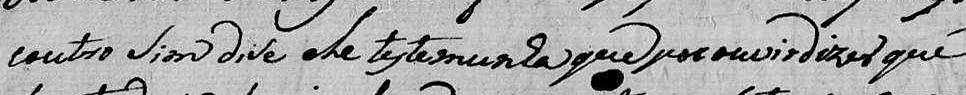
e outrosim dise ele testemunha que por ouvir dizer que
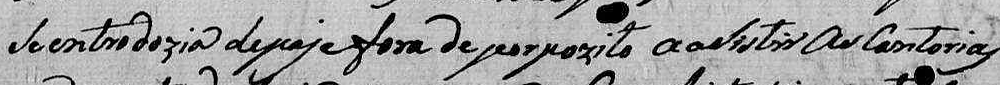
se entrodozia de paje fora de porpozito a asistir as Cantorias
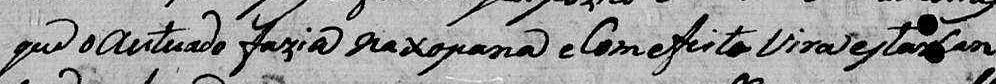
que o autuado fazia na xopana, e Com efeito vira estar Can
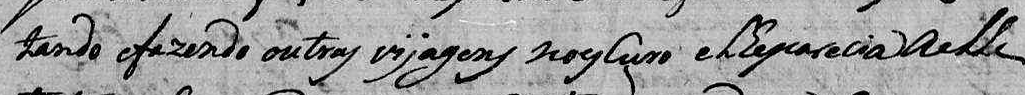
tando e fazendo outras vijagens no esCuro, e lhe parecia a elle
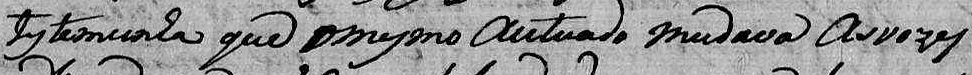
testemunha que o mesmo autuado mudava As vozes
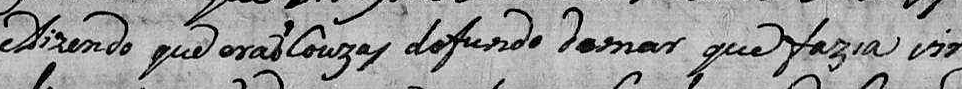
Dizendo que eraõ Couzas do fundo do mar que fazia vir
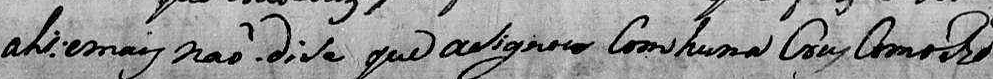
ahi e mais naõ. dise que asignou Com huma Crus Com o Rd.o
